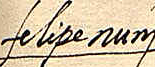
felipe nunz̄
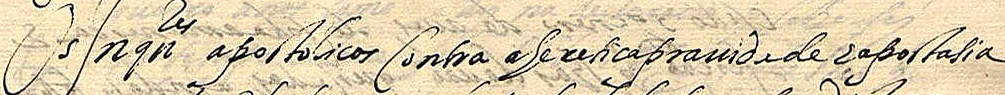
Os Jnqures apostolicos Contra a heretica prauidade E apostasia
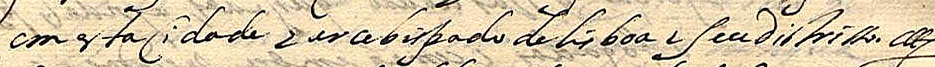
em esta Cidade E arcebispado de lisboa e seu distritto ettꝭ
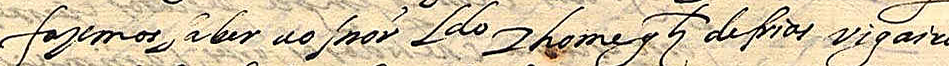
fazemos saber ao snor̄ Ldo Thome ḡlz de frias vigairo
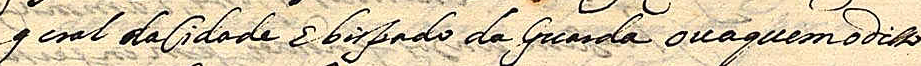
geral da Cidade E bispado da Guarda ou a quem o ditto
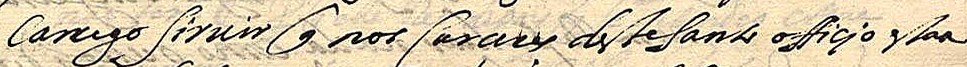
carrego Siruir q̄ nos Carçeres deste Santo officjo estaa
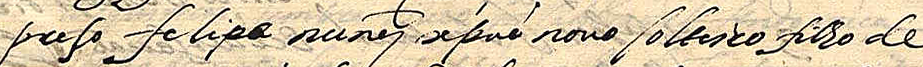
preso felipe nunez xpaõ nouo solteiro filho de
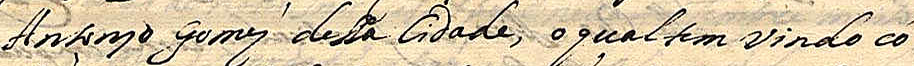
Antonjo Gomez dessa cidade, o qual tem vindo cō
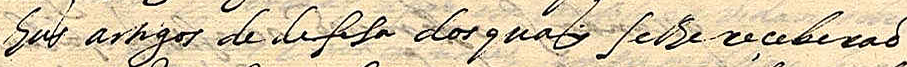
hus̄ artigos de defesa dos quais se lhe reçeberaõ
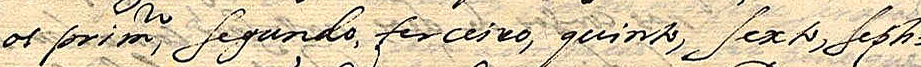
os primro, segundo, terceiro, quinto, sexto, septi
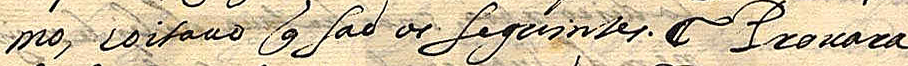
mo, E oitauo q̄ saõ os seguintes. ¶ Prouara
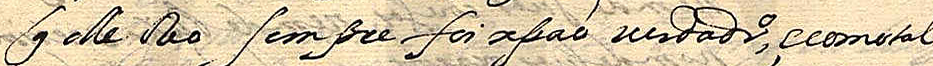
q̄ elle Reo sempre foi xpaõ uerdadro, e como tal
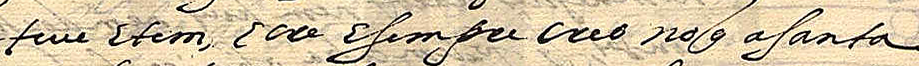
teue E tem, E cre E sempre creo no q̄ a Santa
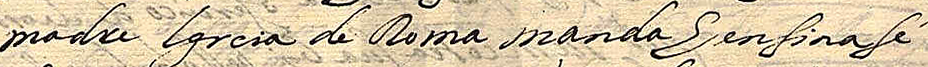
madre Igreia de Roma manda E ensina sē
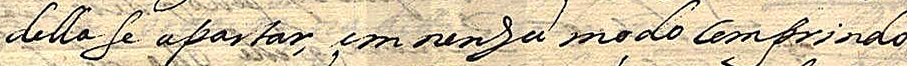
della se apartar, em nenhū modo comprindo
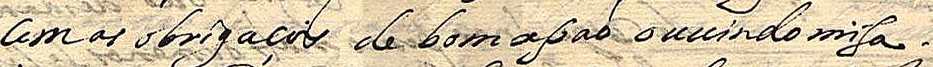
com as obrigaçoĩs de bom xpaõ ouuindo misa
